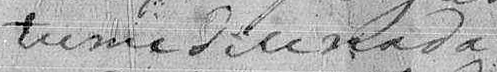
tume dice nada
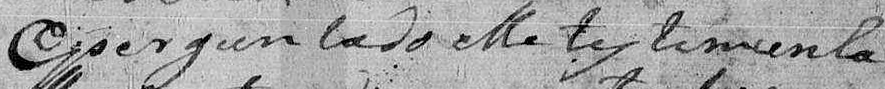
E perguntado elle testemunha
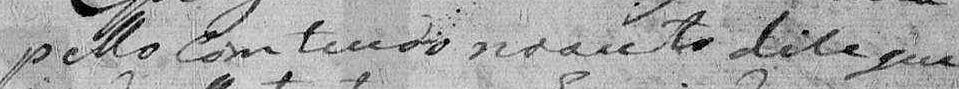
pello Comteudo no auto dice que
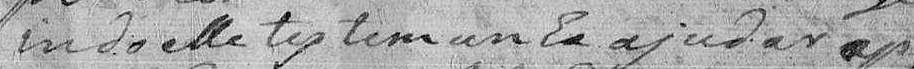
indo elle testemunha ajudar a p
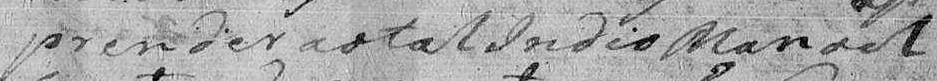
prender ao tal Indio Manoel
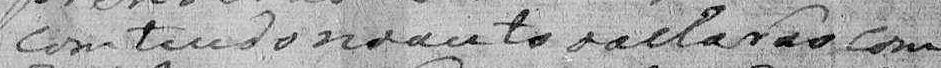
conteudo no auto o acharão com
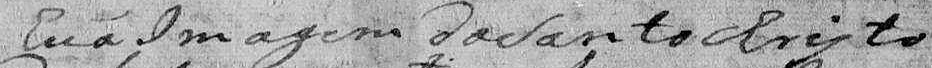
huā Imagem do Santo christo
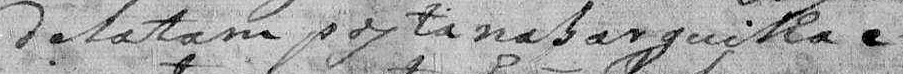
de latam posta na barguilha e
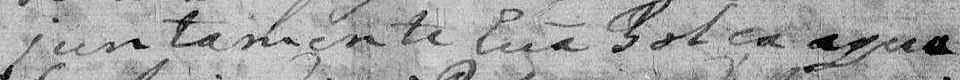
juntamente huā bolça a qua
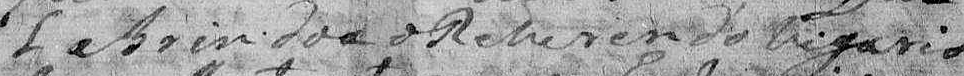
l abrindoa o Reverendo Vigario
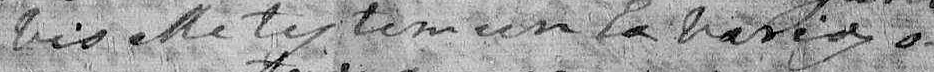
vio elle testemunha varios o
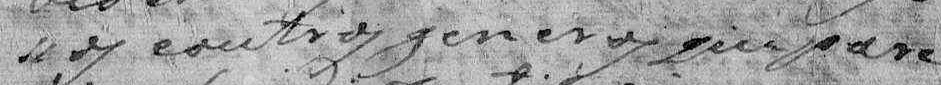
ssos e outros generos que pare
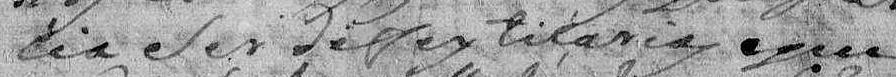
cia ser de feytiçarias e que
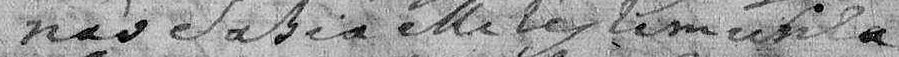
não sabia elle testemunha
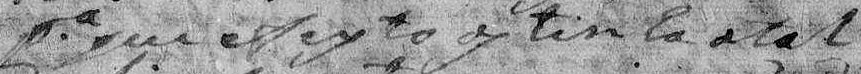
p.a que efeyto os tinha o tal
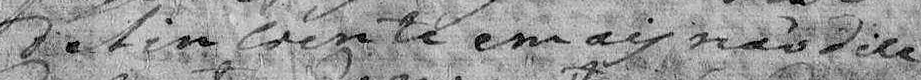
delincoente e mais naõ dice
